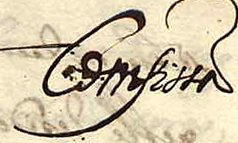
Comfissaõ
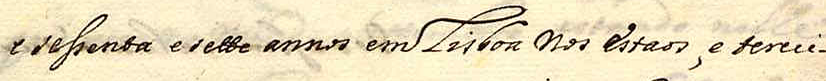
e sessenta e sette annos em Lisboa nos Estaos, e tercei
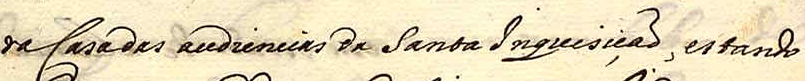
ra Casa das audiencias da santa Inquisiçaõ, estando
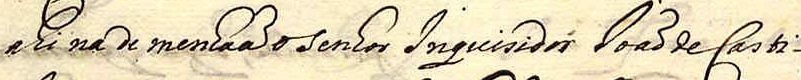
ahi na de menhaã o senhor Inquisidor Joaõ de Casti
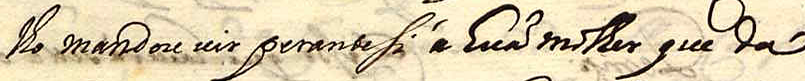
lho mandou uir perante si a huā molher que da
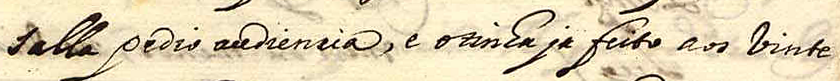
salla pedio audiencia, e o tinha ja feito aos vinte
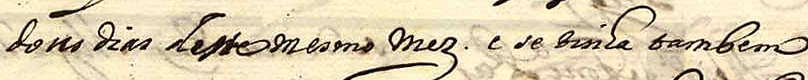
dous dias deste mesmo mez. e se tinha tambem
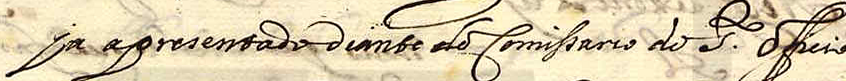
ja apresentado diante do Comissario do s.to officio
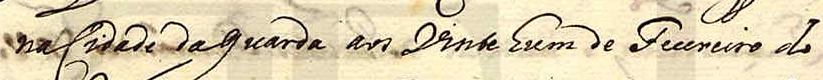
na Cidade da Guarda aos vinte hum de Feuereiro do
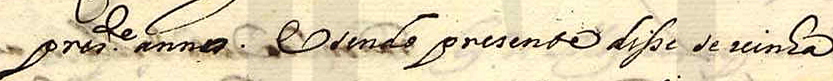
pres.te anno. E sendo presente disse se uinha
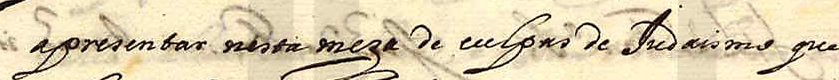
apresentar nesta meza de culpas de Judaismo que
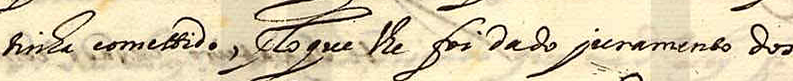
tinha comettido, p̄lo que lhe foi dado juramento dos
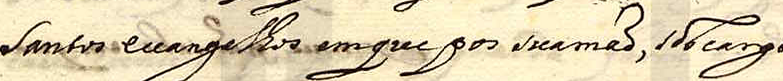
Santos euangelhos em que pos sua maõ, sob cargo
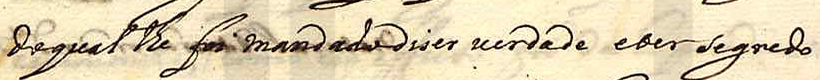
do qual lhe foi mandado diser uerdade e ter segredo
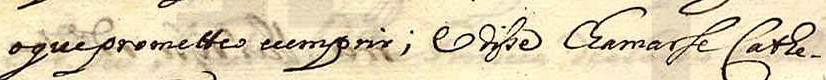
o que prometteo cumprir; E disse Chamarse Cathe
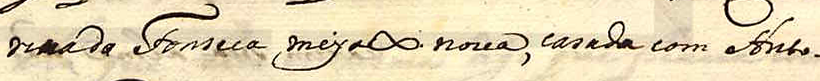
rina da Fonseca meya X. noua, casada com Anto
